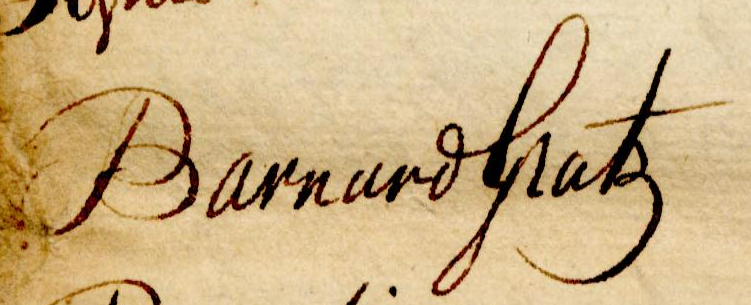Barnard Gratz
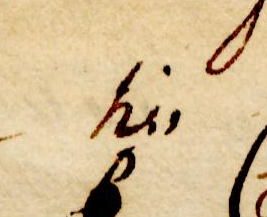his
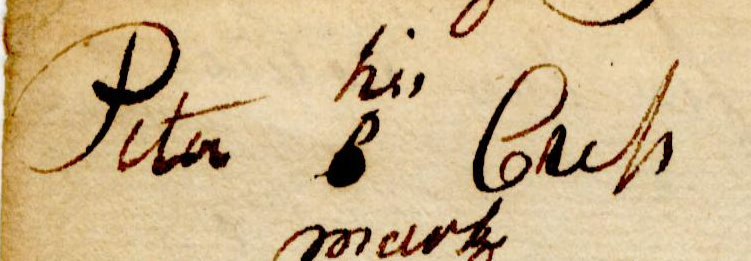Peter P Cress
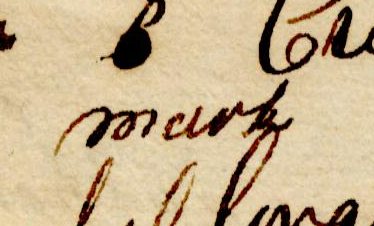Mark
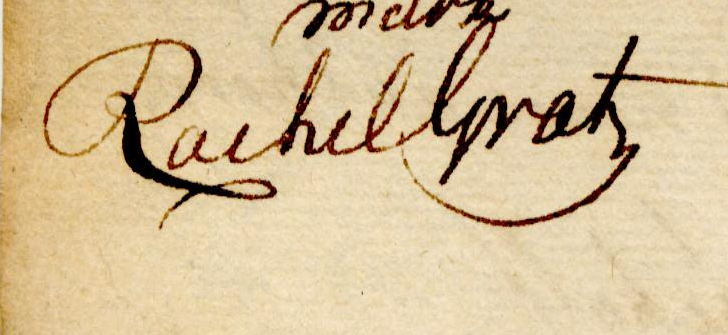Rachel Gratz
